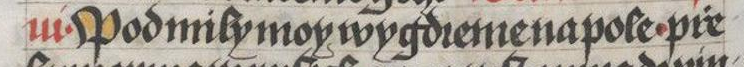ui. Pod mily moy wygdieme na pole.pṙe
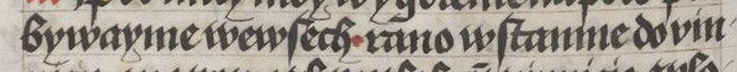bywayme we wſech.rano wſtanme do vin¬
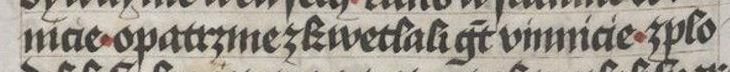nície.opatrzme kwetlali ḡt vinnicie. zplo¬
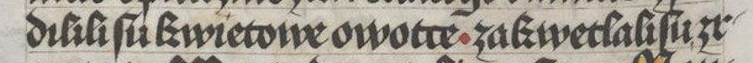dilili ſú kwietowe owotce.zakwetlali ſu zr¬
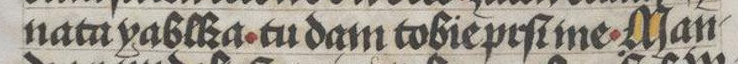nata yablka.tu dam tobie prſí me.Man¬
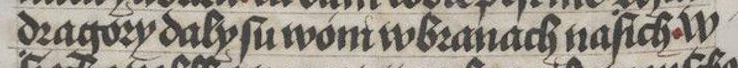dragory daly ſu wóni wbranach naẛich.W¬
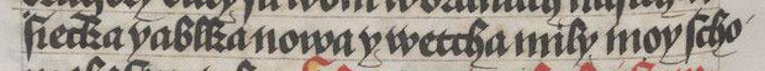ẛiecka yablka nowa y wetcha mily moy ſcho¬
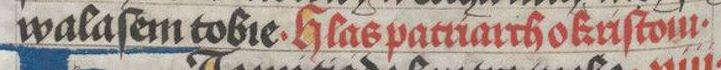wala ſem tobie.Hlas patriarch o kriſtoui.
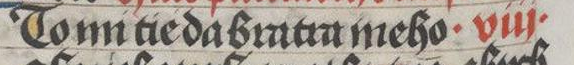To mi tie da bratra meho. viij.
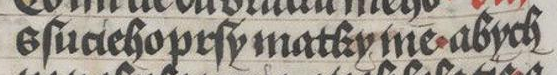sſucieho prſy matky me.abych
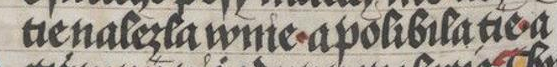tie nalezla w nie a polibila tie.a
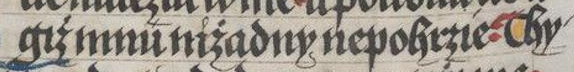giż mnú níżadny nepohrzíe?Chy¬
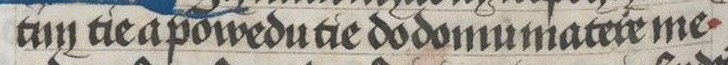tím tíe a powedu tie do domu mateṙe me.
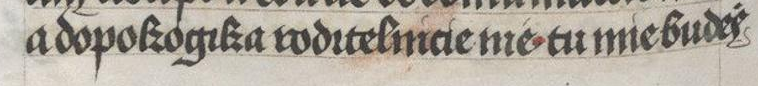a dopokogika roditedlnicie mé.tu mie budeṡ
